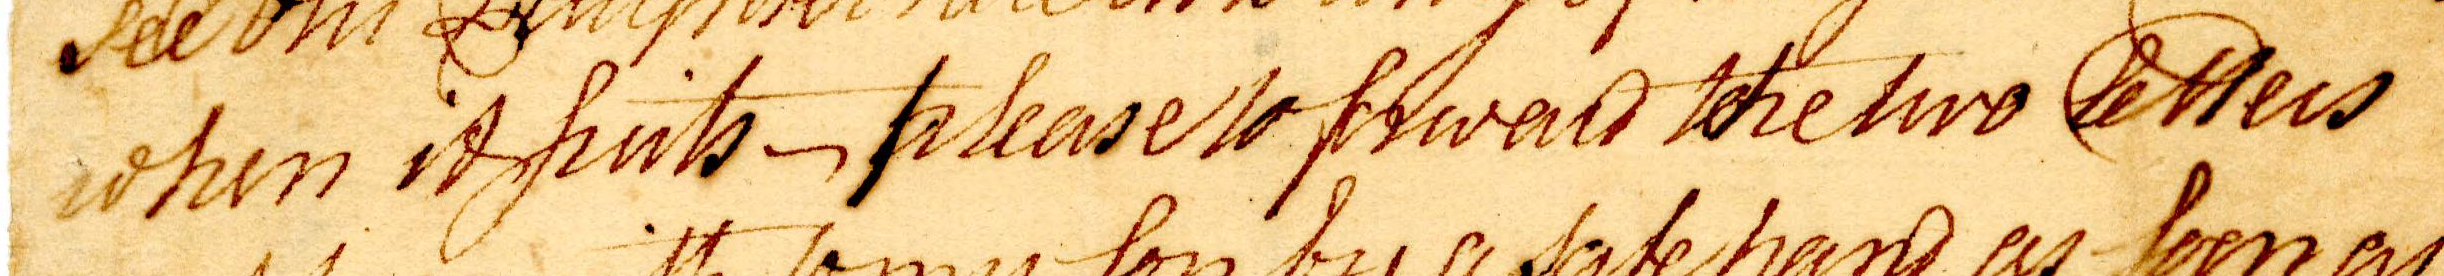when it suits. please to forward the two Letters
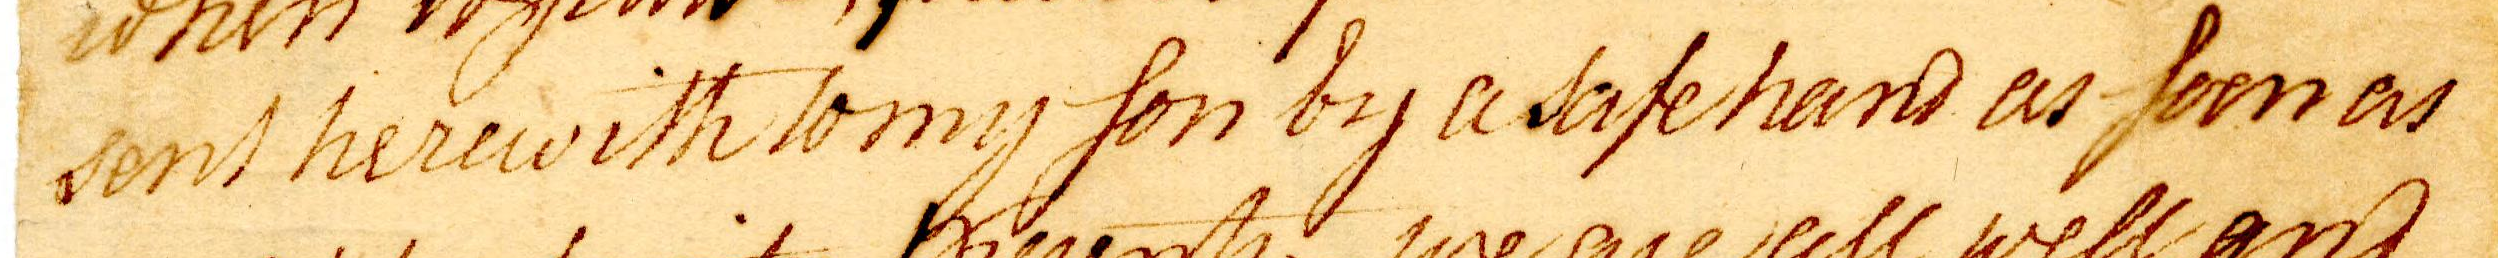sent herewith to my son by a safe hand as soon as
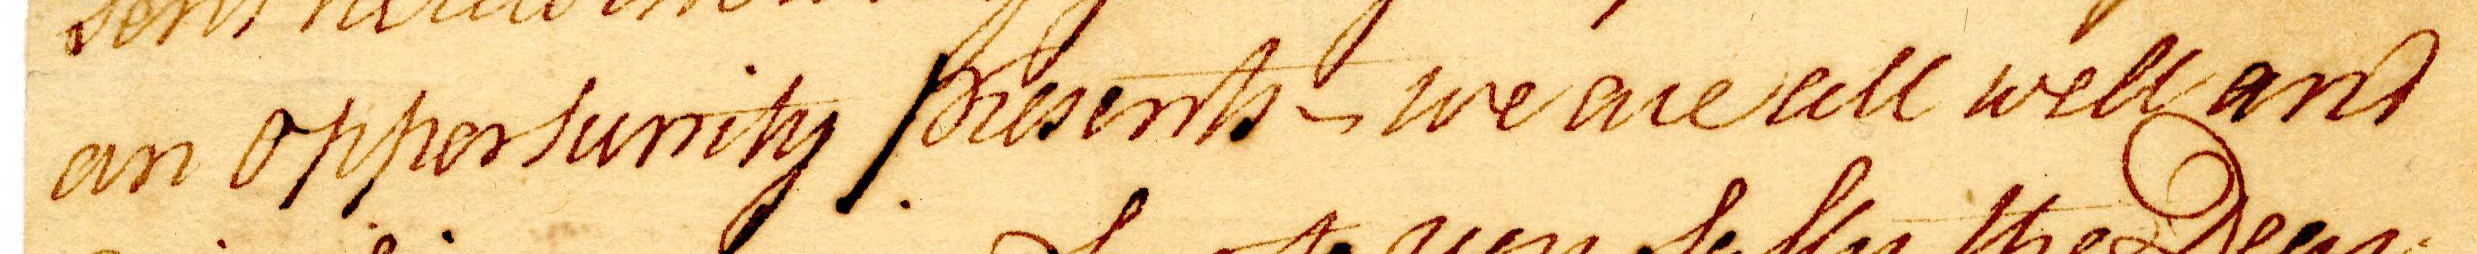an opportunity presents- We are all well and
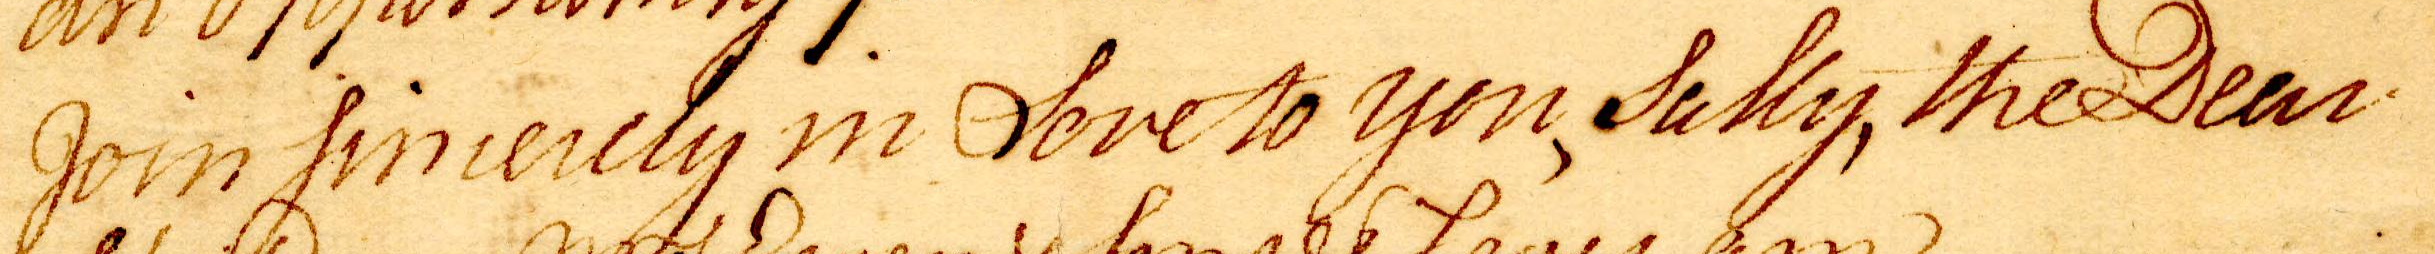join sincerely in Love to you, Sally, the Dear
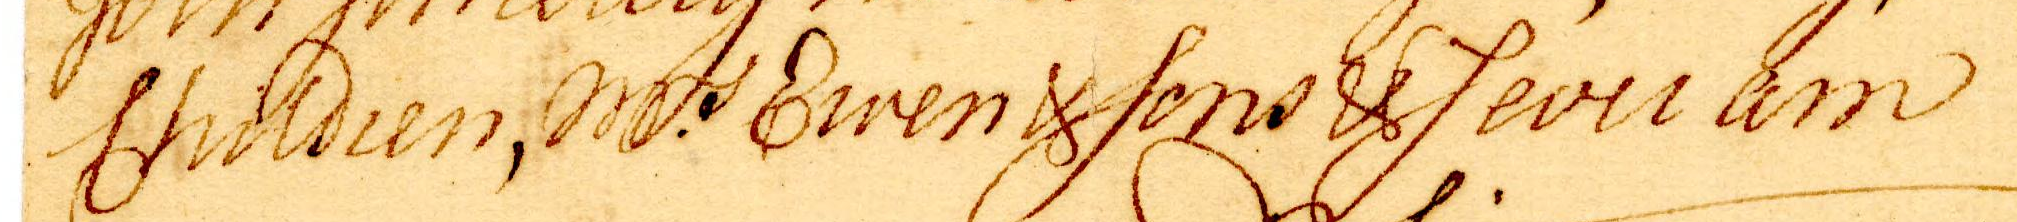Children, M^rs. Ewen & Son & I ever am
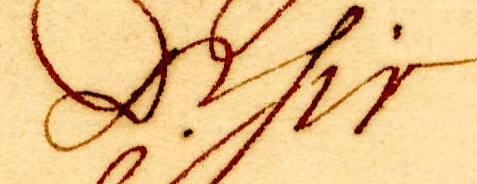D^r Sir
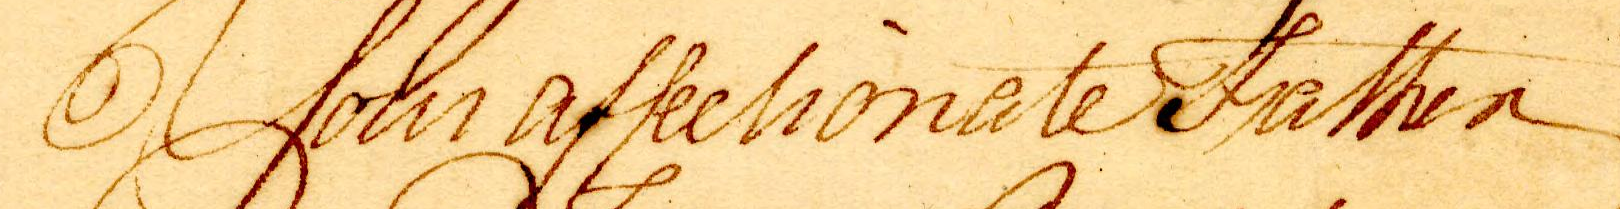Your affectionate Father
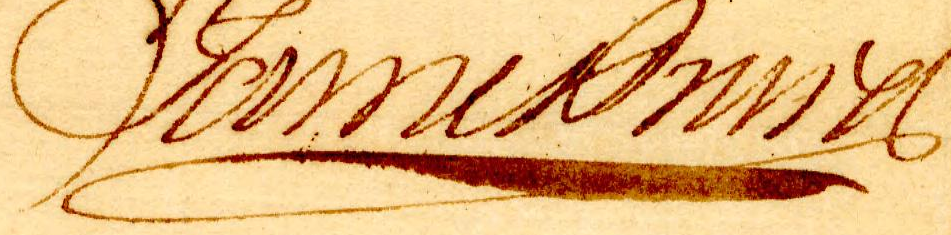James Burd
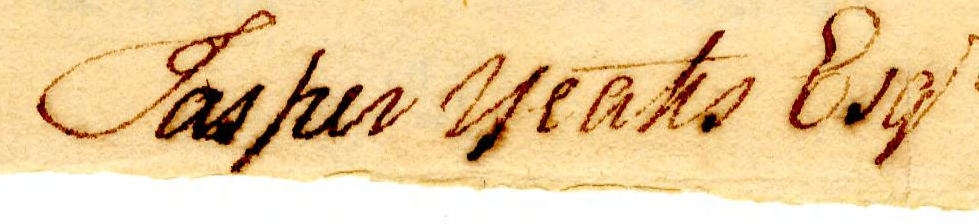Jasper Yeates Esq^r.
